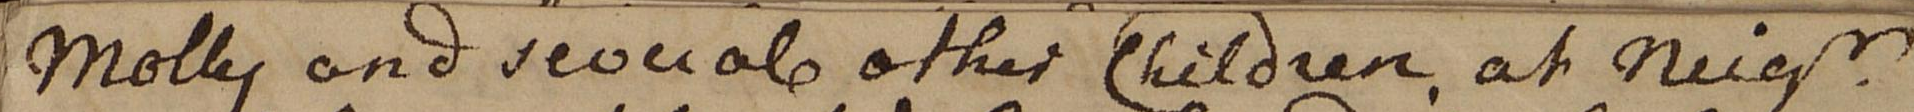Molly and several other Children, at Neig^r.
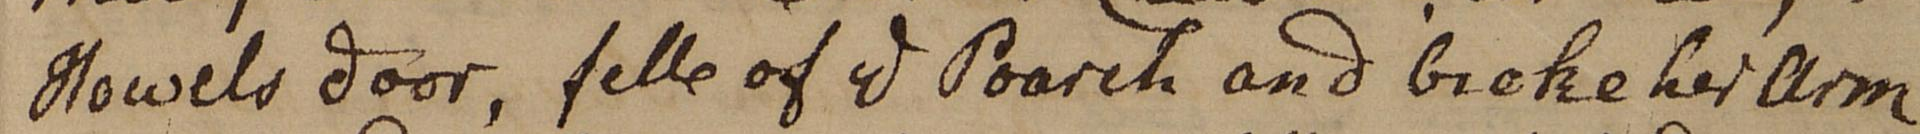Howels door, fell of y^e Poarch and broke her Arm,
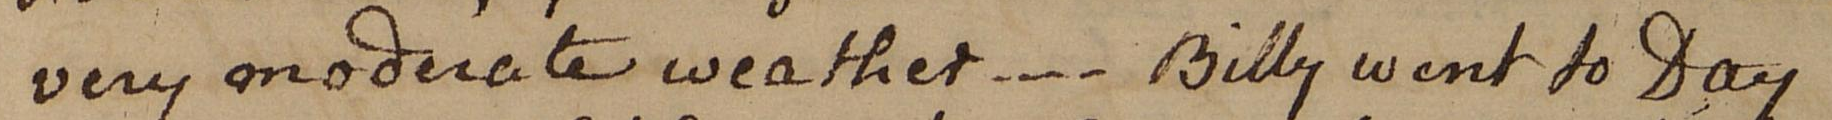very moderate weather-- Billy went to Day
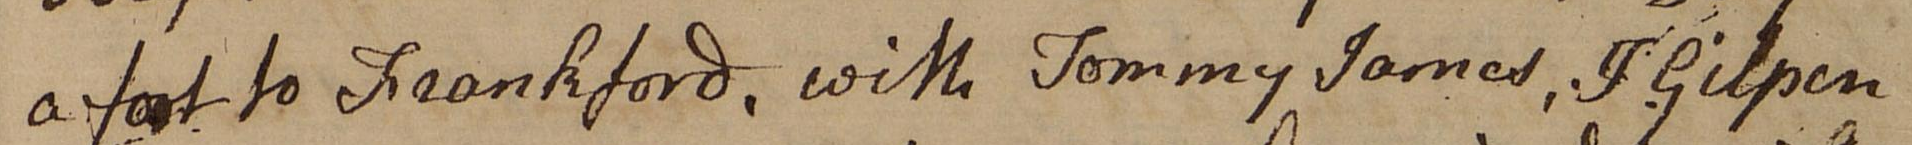a foot to Frankford, with Tommy James, F Gilpen
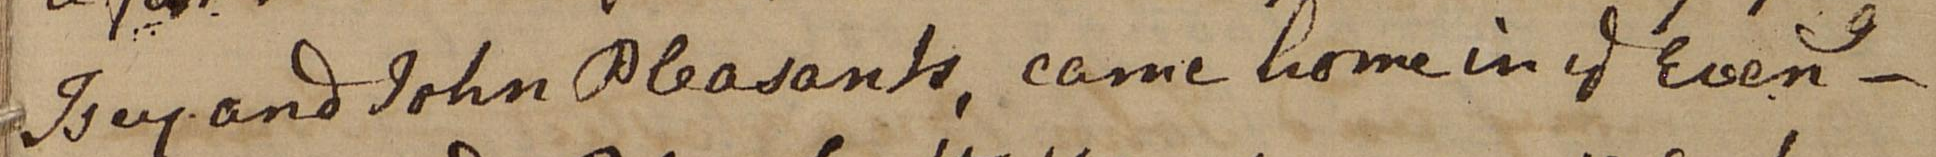Jsey and John Pleasants, came home in y^e Even^g-
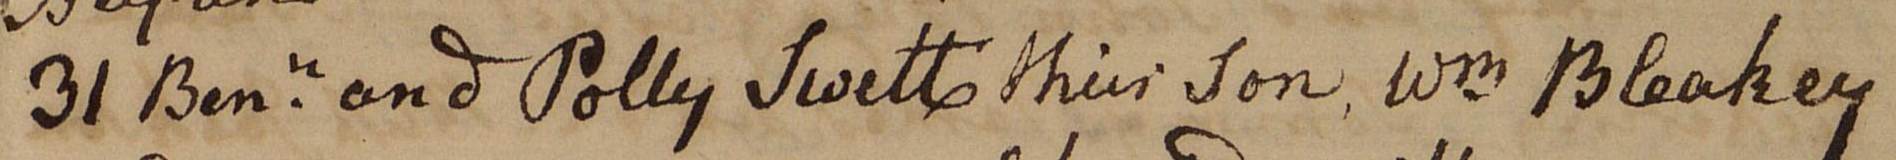31 Ben^n. and Polly Swett their Son, W^m. Bleakey
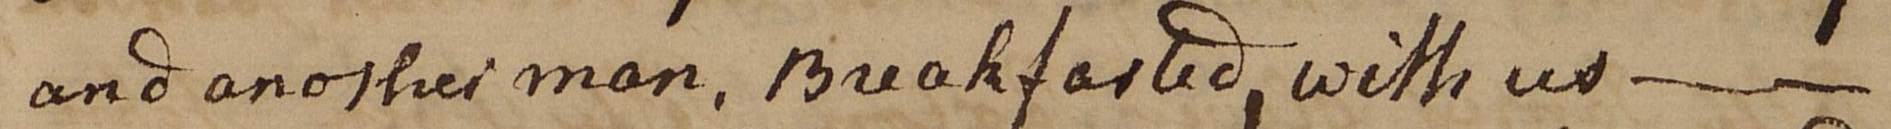and another man, Breakfasted with us-
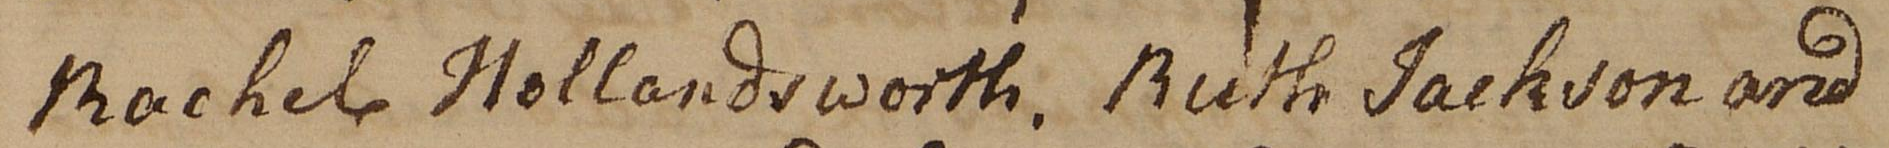Rachel Hollandsworth, Ruth Jackson and
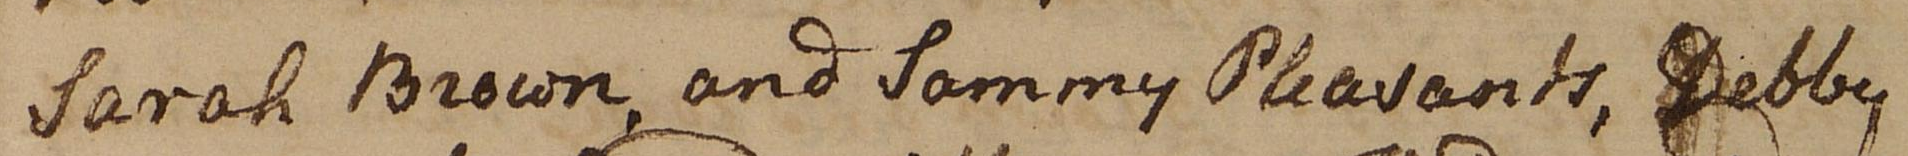Sarah Brown, and Sammy Pleasants, Debby
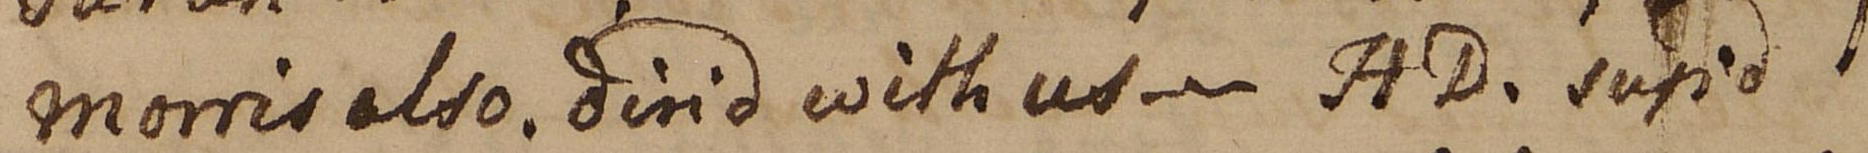Morris also. din'd with us- HD. sup'd
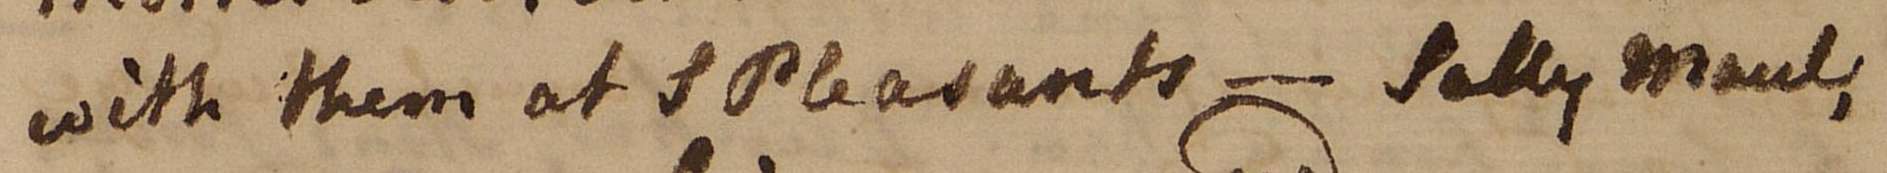with them at S Pleasants- Sally Maul,
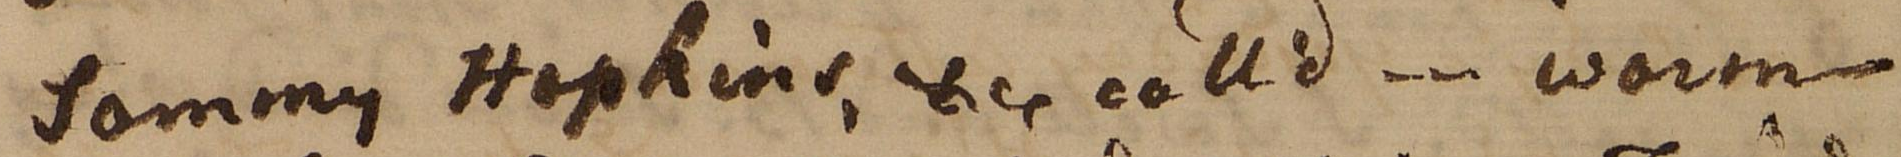Sammy Hopkins, &c call'd-- warm-
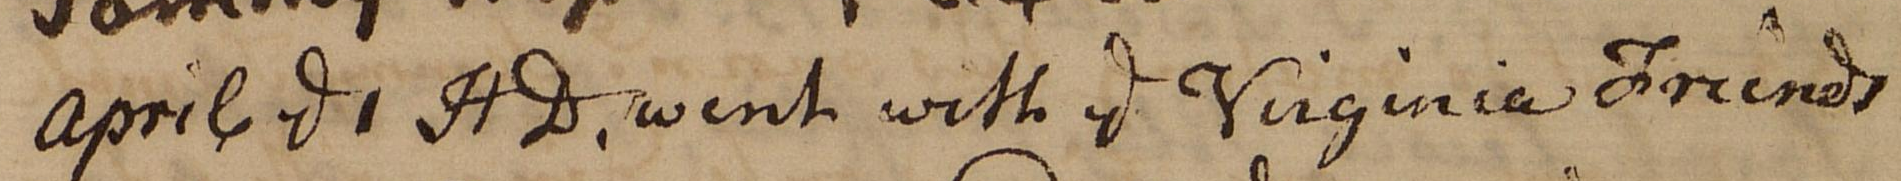April y^e 1 HD. went with y^e Virginia Friends
